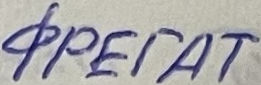фрегат
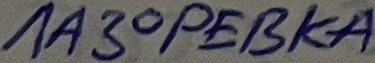лазоревка
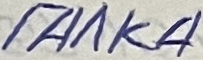галка
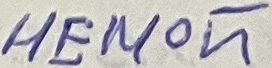немой
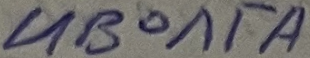иволга
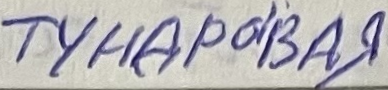тундровая
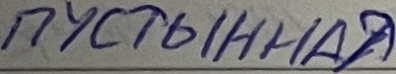пустынная
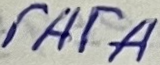гага
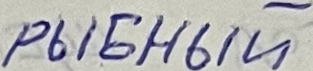рыбный
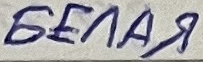белая
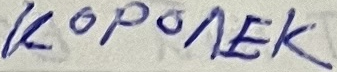королек
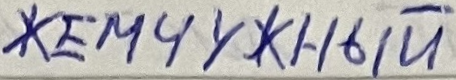жемчужный
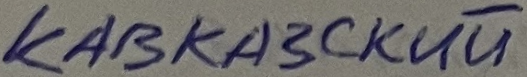кавказский
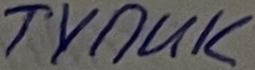тупик
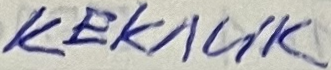кеклик
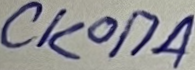скопа
